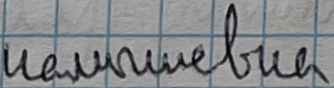камышевка
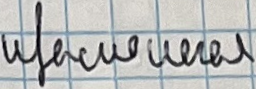красноногая
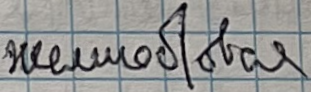желтобровая
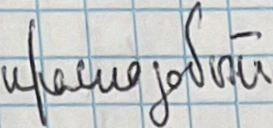краснозобый
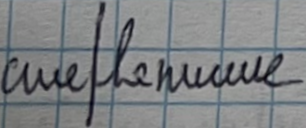стервятник
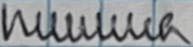питта
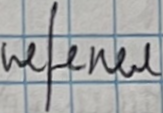перепел
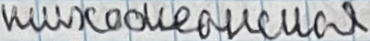тихоокеанская
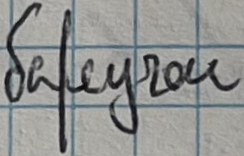барсучок
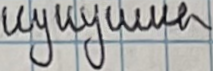кукушка
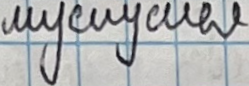мускусная
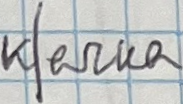крачка
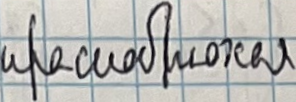краснобрюхая
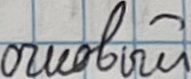очковый
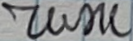чиж
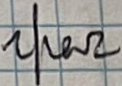грач
